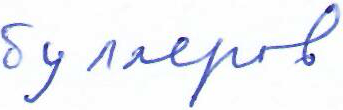буллеров
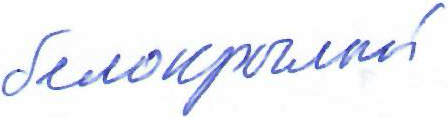белокрылый
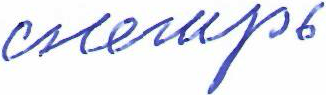снегирь
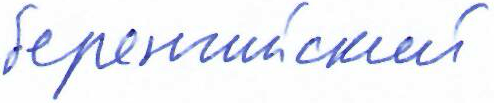беренгийский
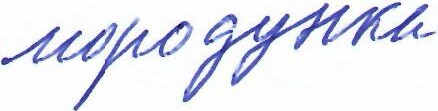мородунка
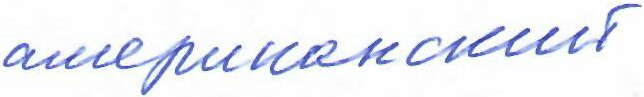американский
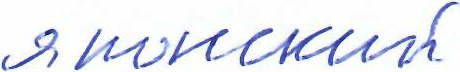японский
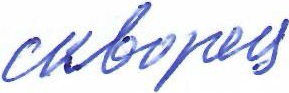скворец
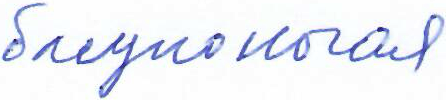бледноногая
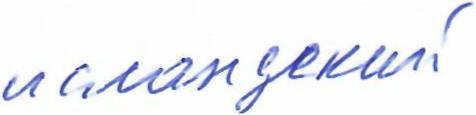исландский
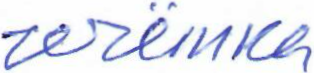чечётка
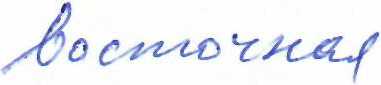восточная
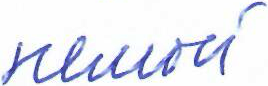немой
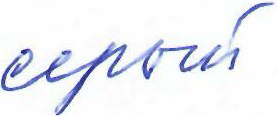серый
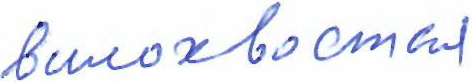вилохвостая
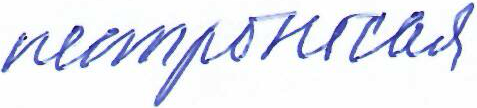пестроносая
